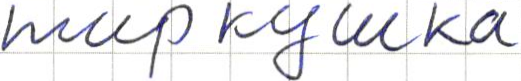тиркушка
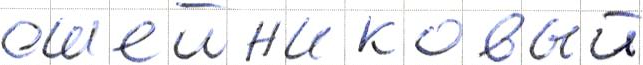ошейниковый
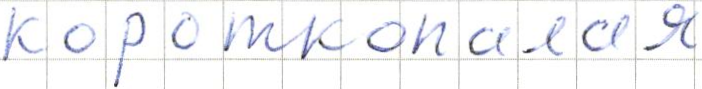короткопалая
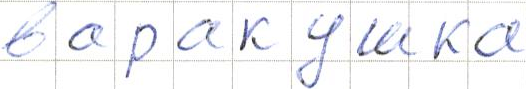варакушка
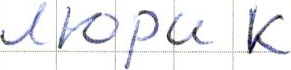люрик
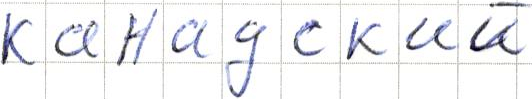канадский
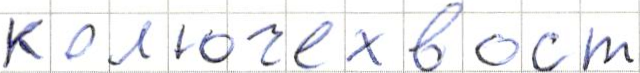колючехвост
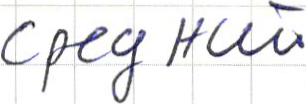средний
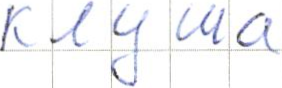клуша
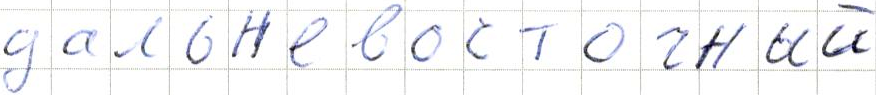дальневосточный
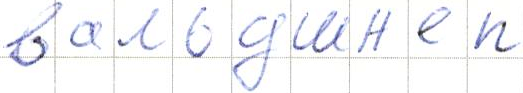вальдшнеп
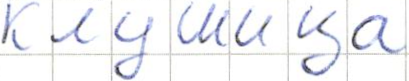клушица
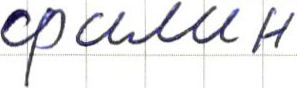филин
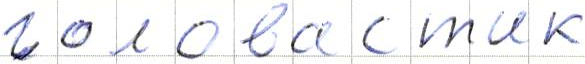головастик
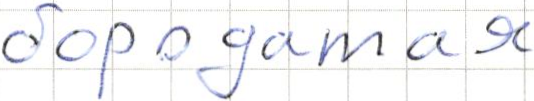бородатая
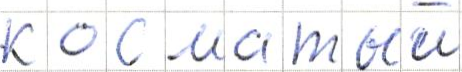косматый
